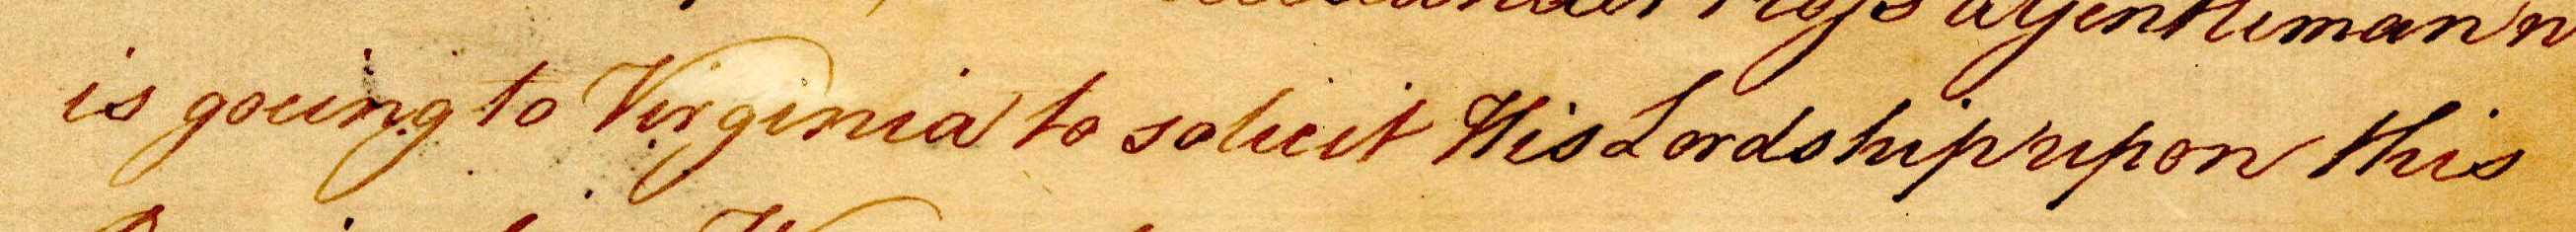is going to Virginia to solicit His Lordship upon this
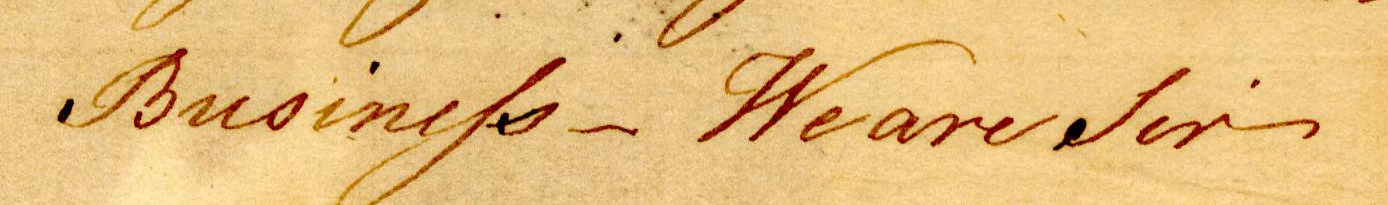Business- We are Sir
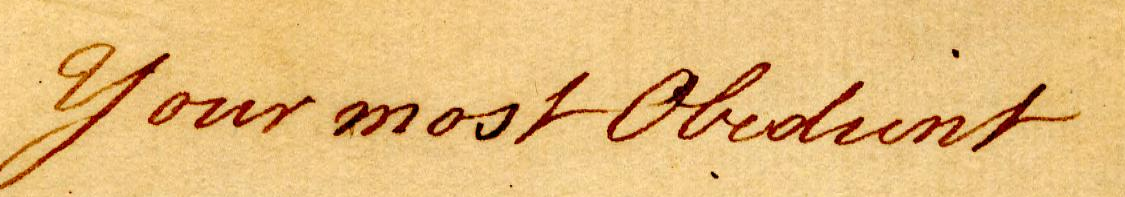Your most Obedeint
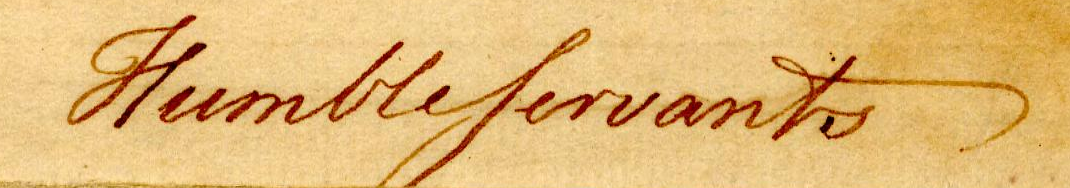Humble servants
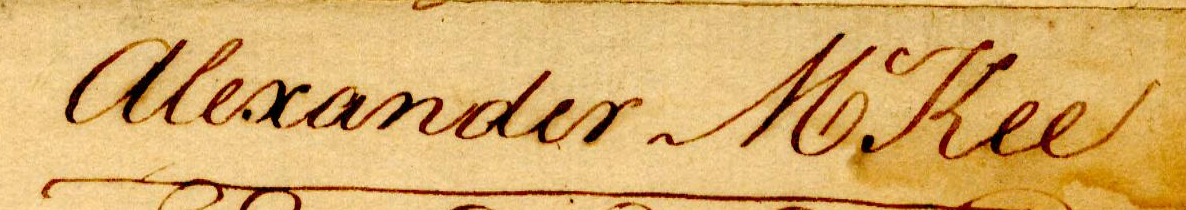Alexander M^cKee
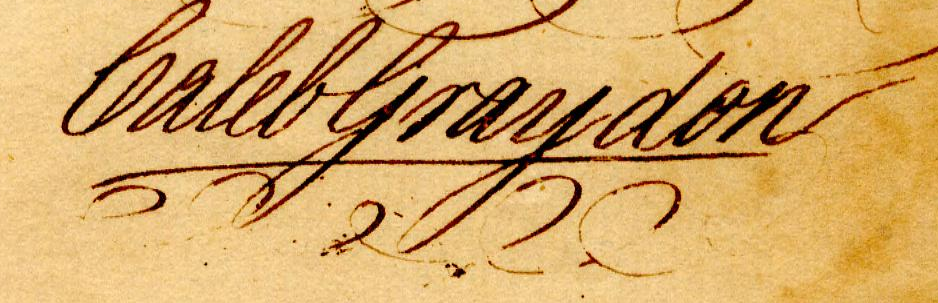Caleb Graydon
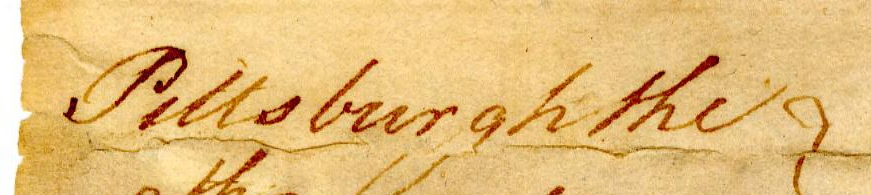Pittsburgh the
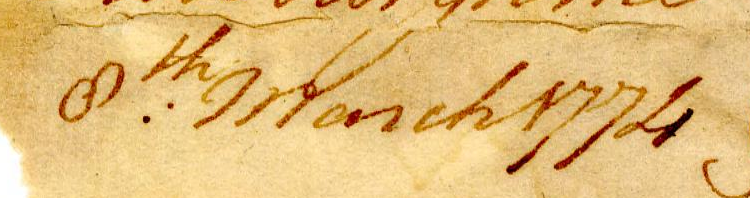8^th: March 1774
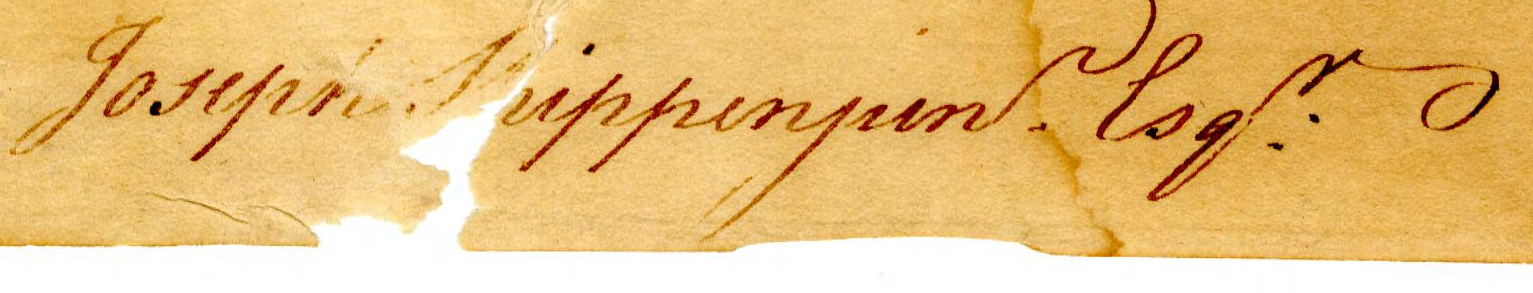Joseph Shippen jun^r. Esq^r:
